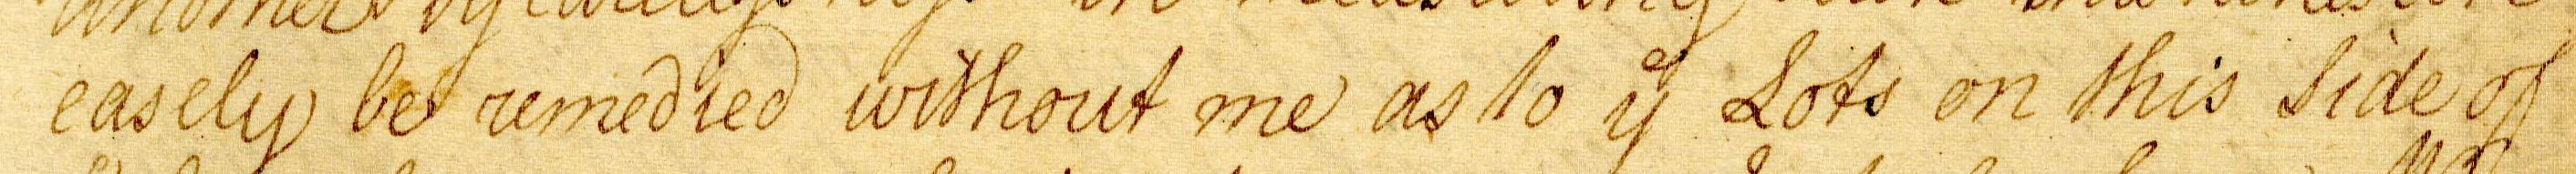easely be remedied without me as to y^e Lots on this side of
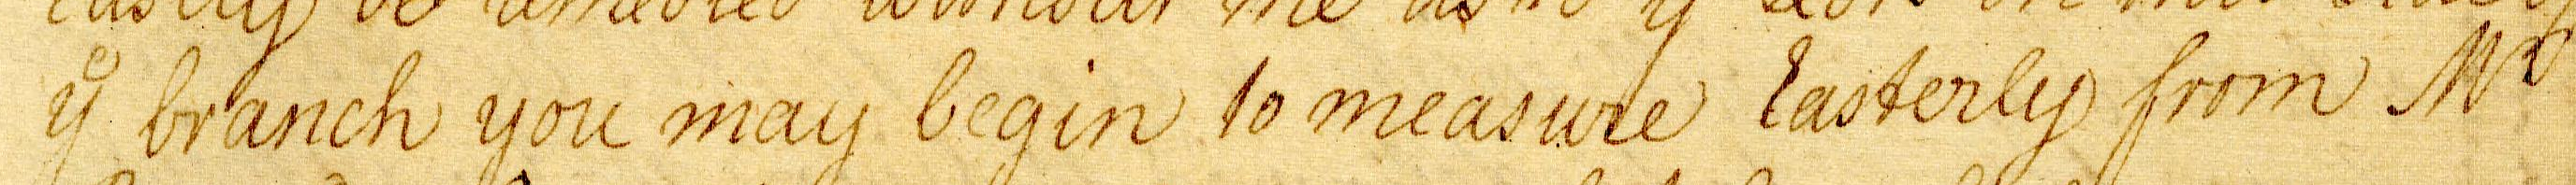y^e branch you may begin to measure Easterly from M^r
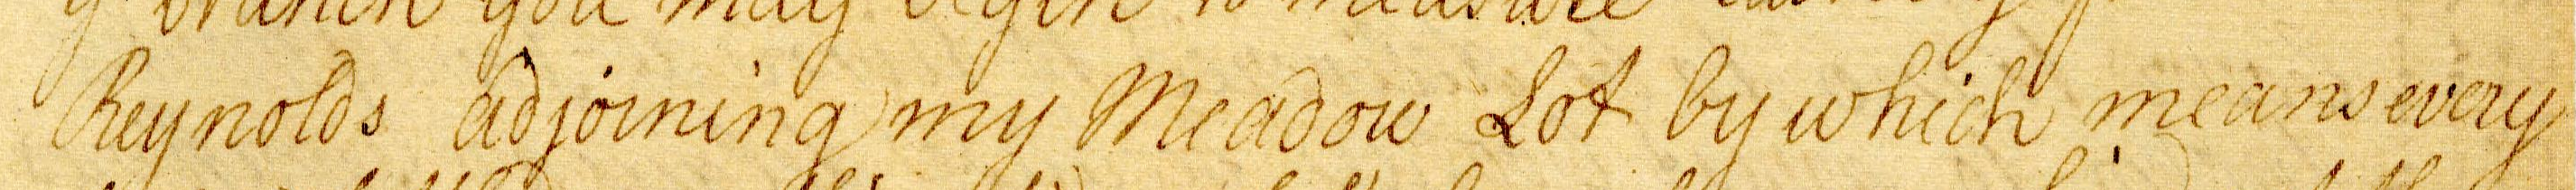Reynolds adjoining my Meadow Lot by which means every
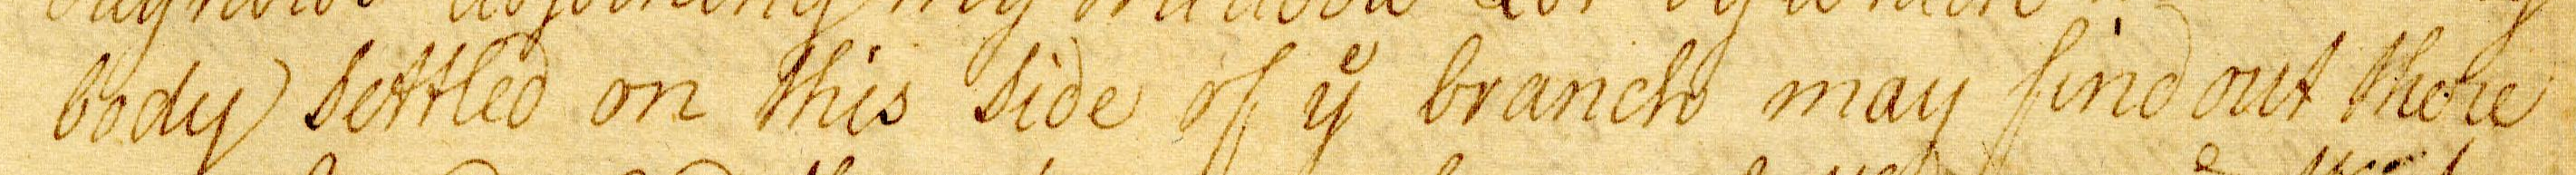body settled on this side of y^e branch may find out there
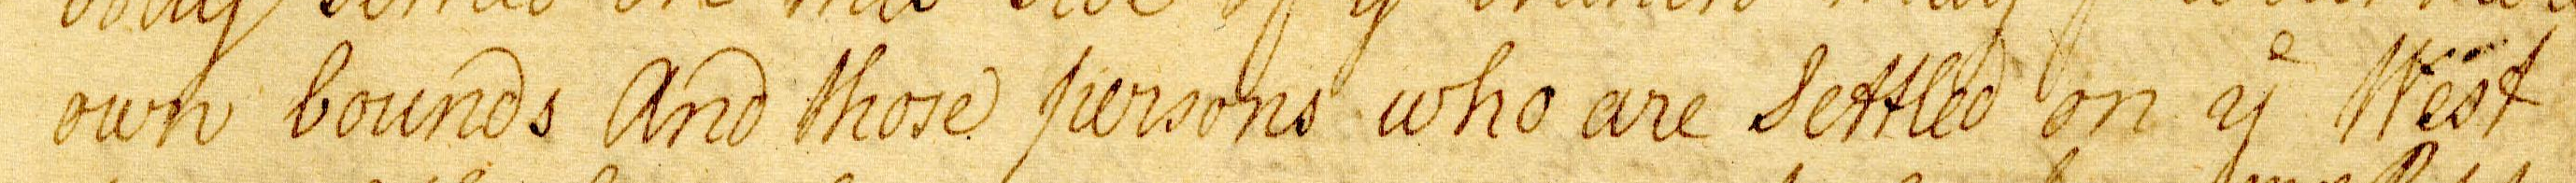own bounds And those persons who are Settled on y^e West
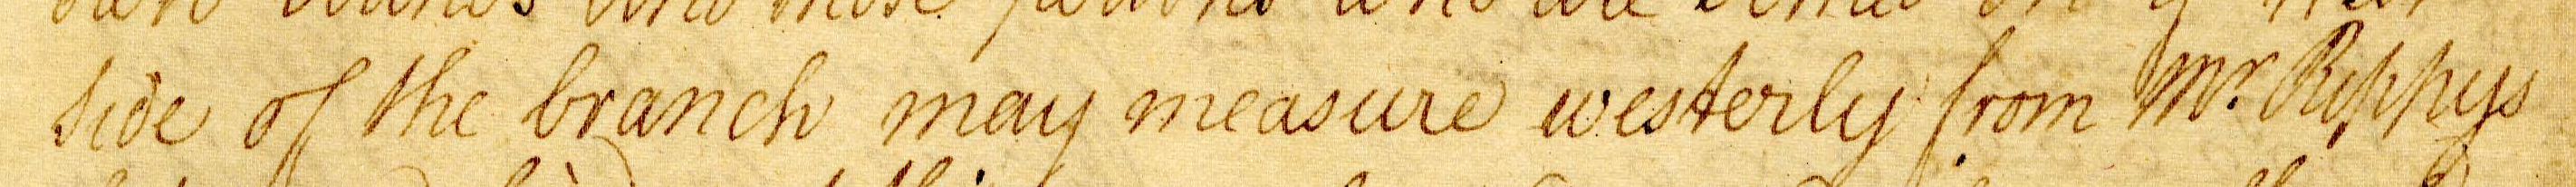side of the branch may measure westerly from M^r. Ruppys
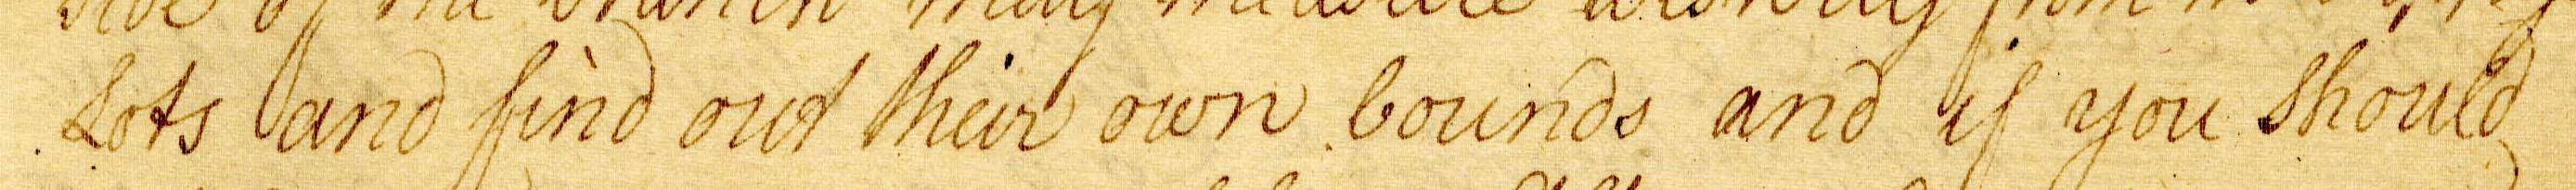Lots and find our their own bounds and if you should
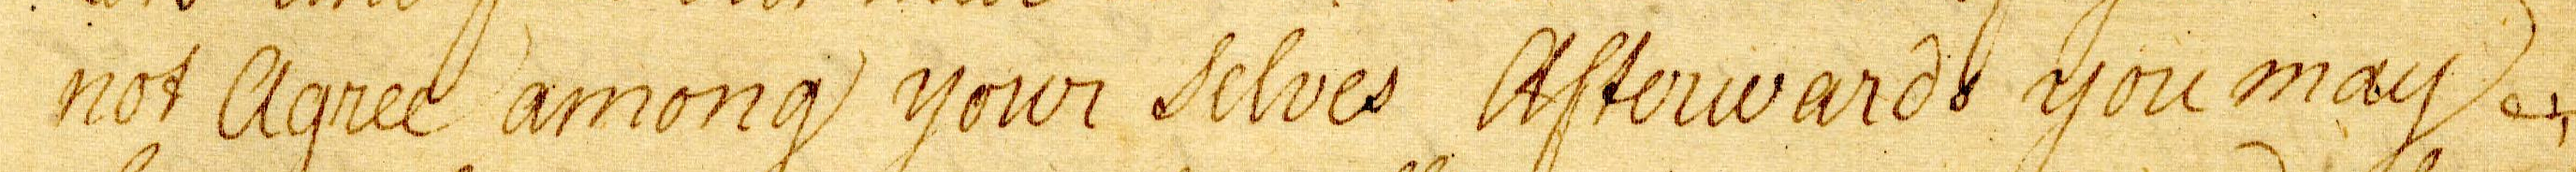not Agree among your selves Afterwards you may,
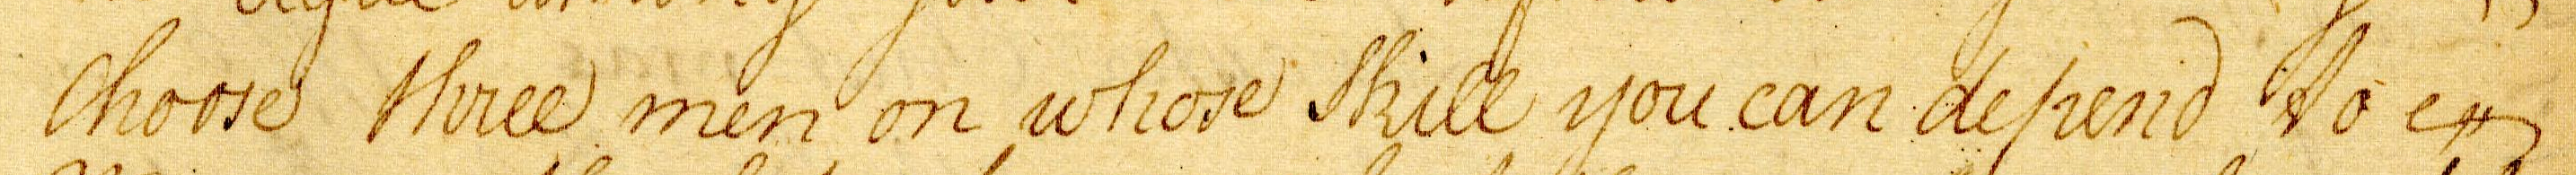choose three men on whose skill you can depend to
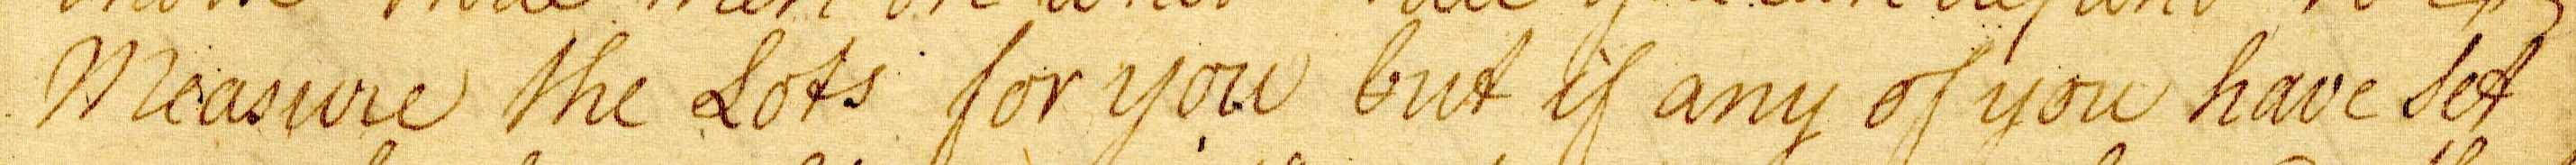Measure the Lots for you but if any of you have set
